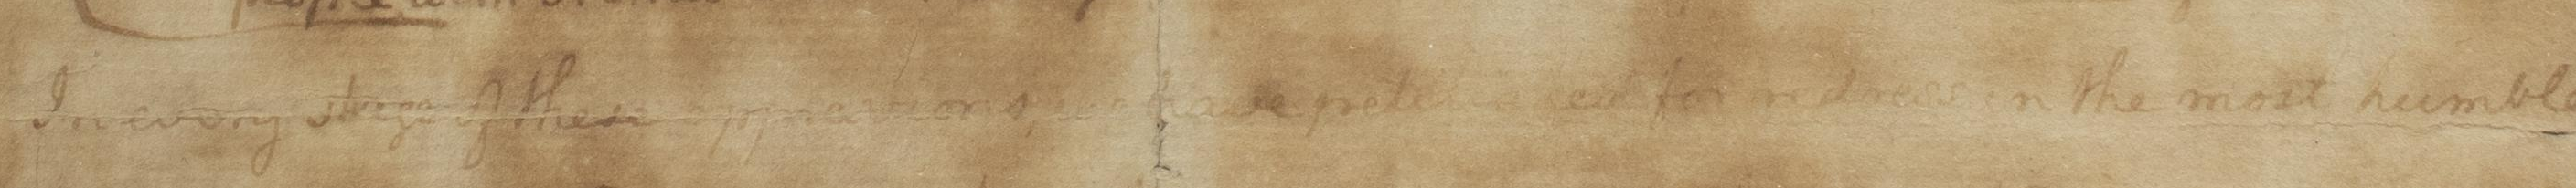In every stage of these oppression we have petitioned for redress in the most humble
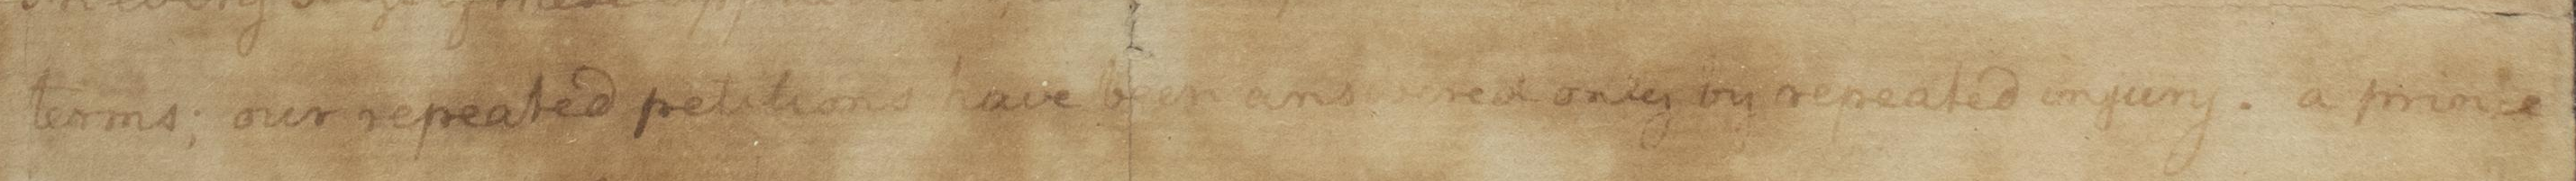terms; our repeated petitions have been answered only by repeated injury. A prince
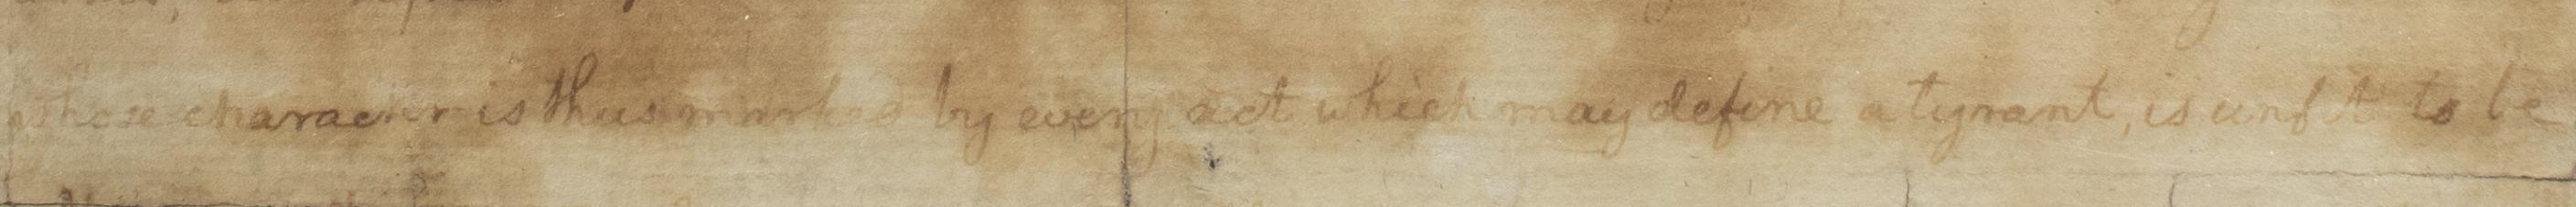whose character is thus marked by every act which may define a tyrant, is unfit to be
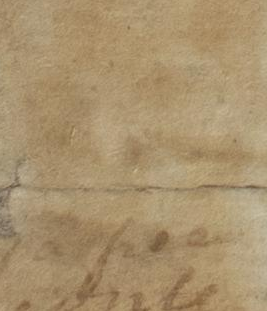a free
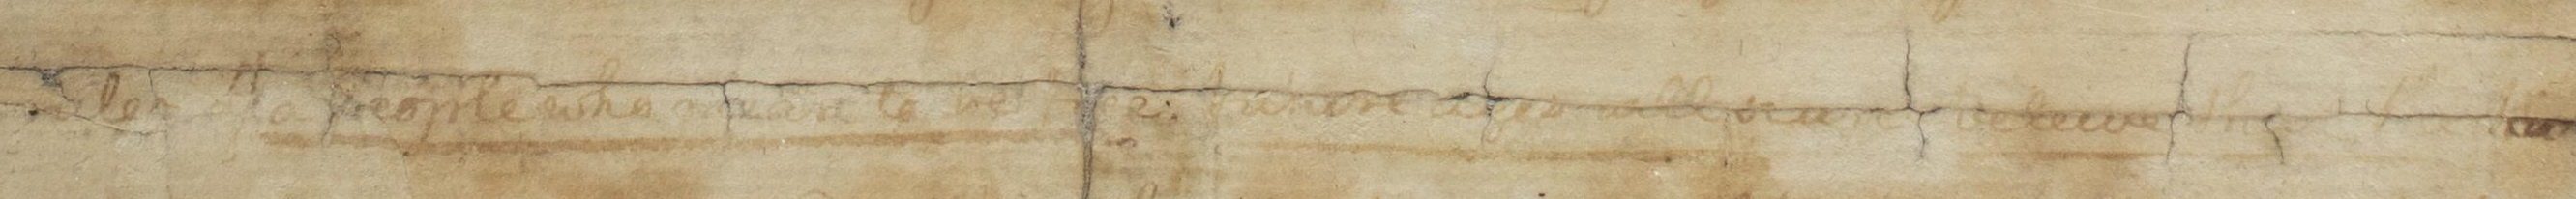a ruler of the people who want to be free, who want also all [______]
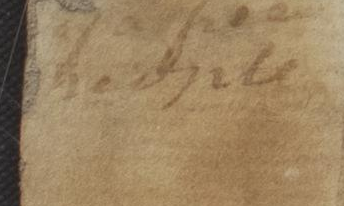people
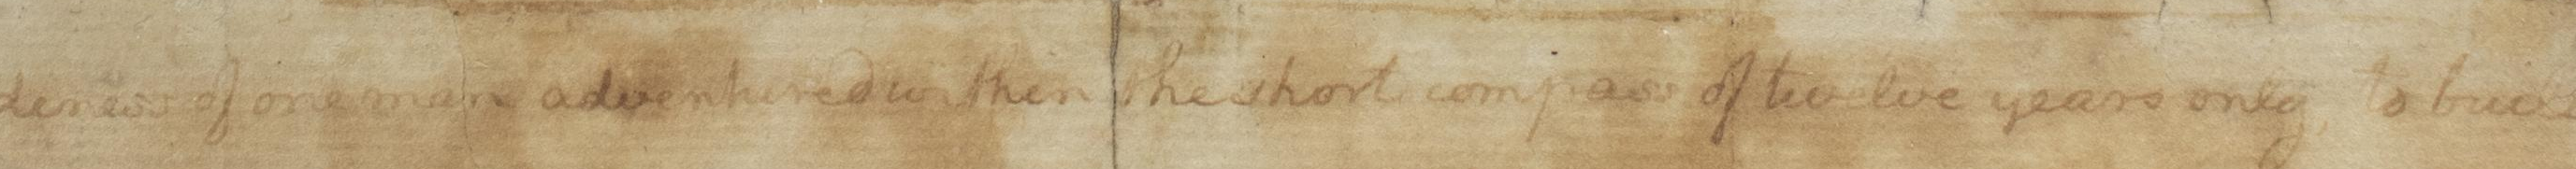denies of our adventured withn the short compass of twelve years only, to bring
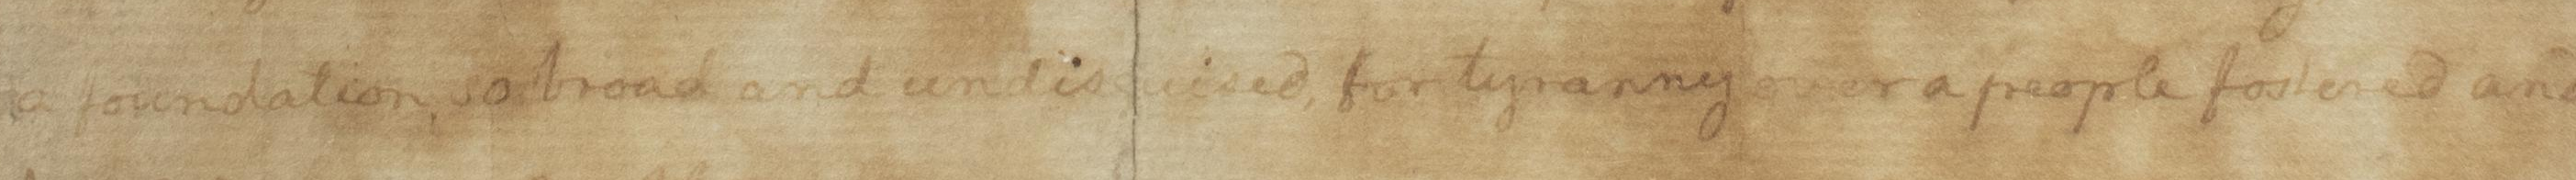a foundation, so broad and desireded, for tyranny ever a people fostered and
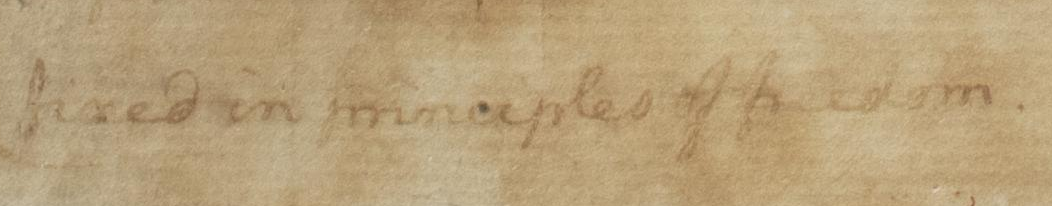fixed in principles of freedom
